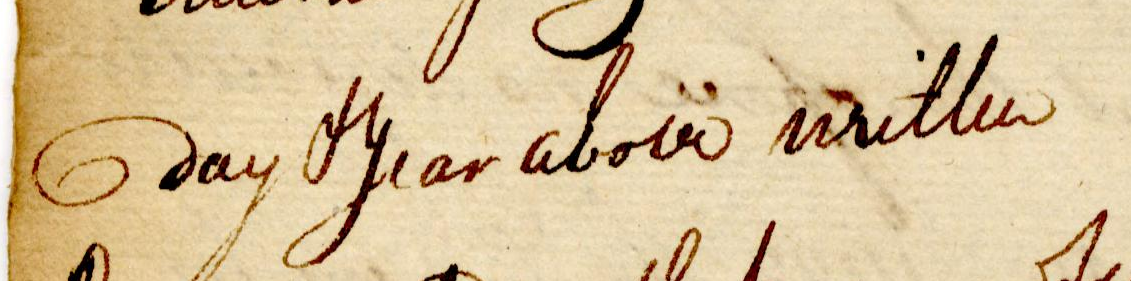day & year above written
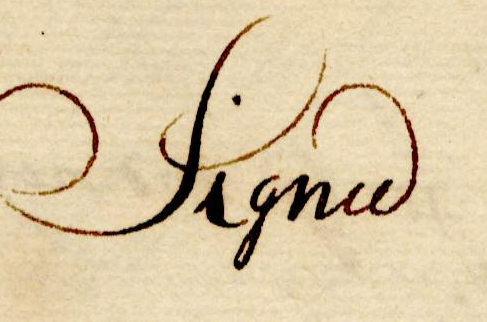Signed
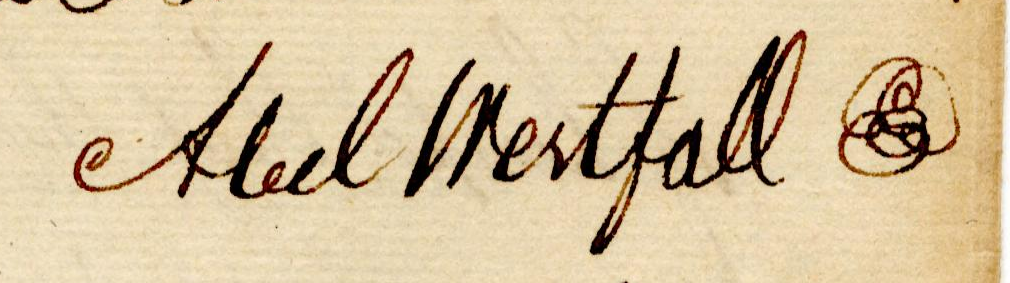Abel Westfall
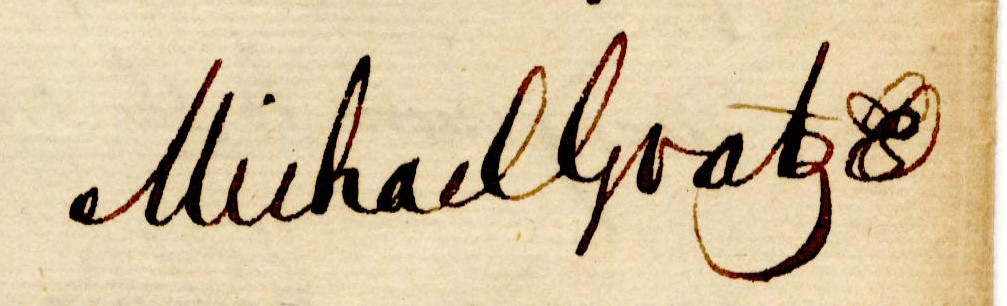Michael Gratz
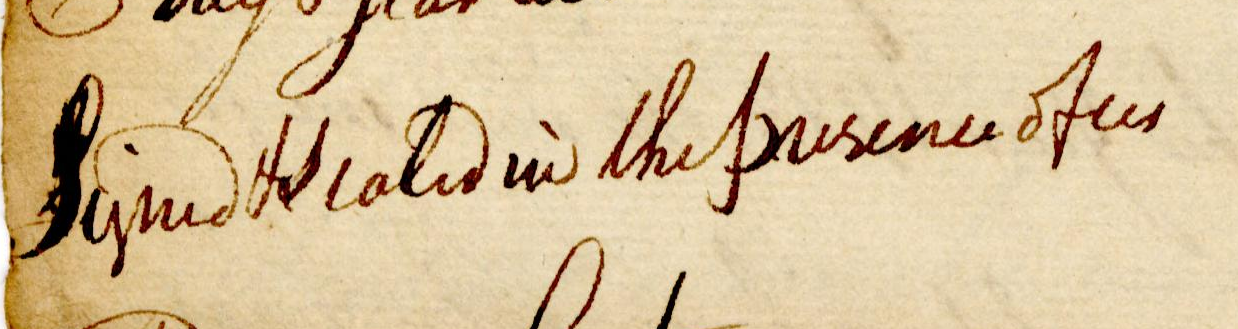Signed & called in the presence of
